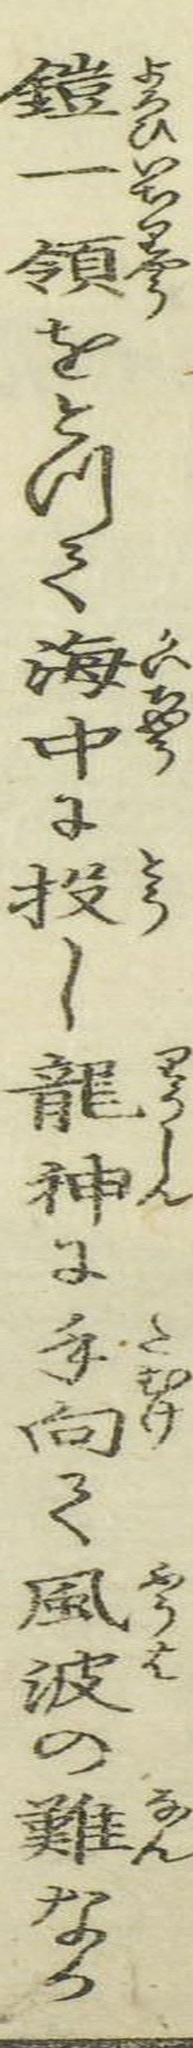鎧一領をとつて海中に投し龍神に手向て風波の難なか
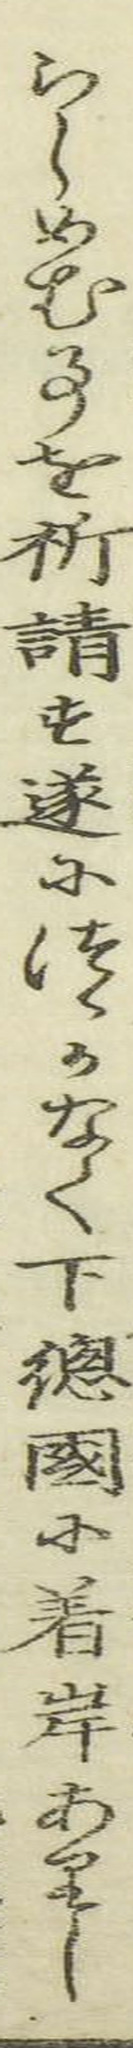らしめむ事を祈請す遂につゝかなく下総國に着岸ありし
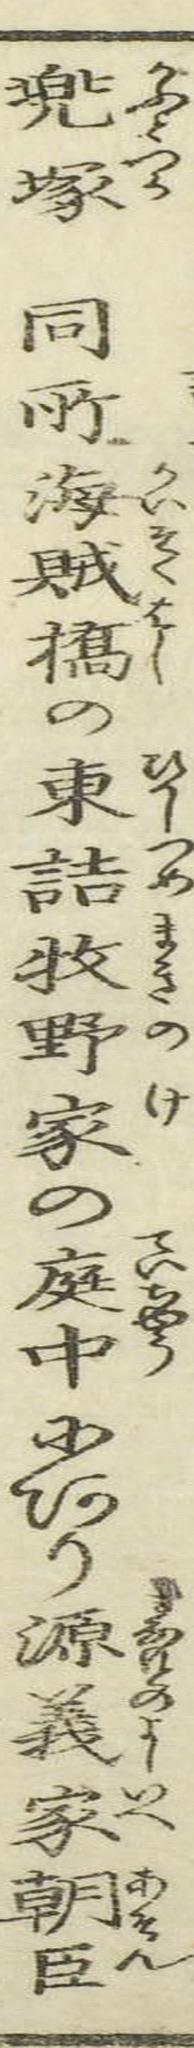兜塚同所海賊橋の東詰牧野家の庭中にあり源義家朝臣
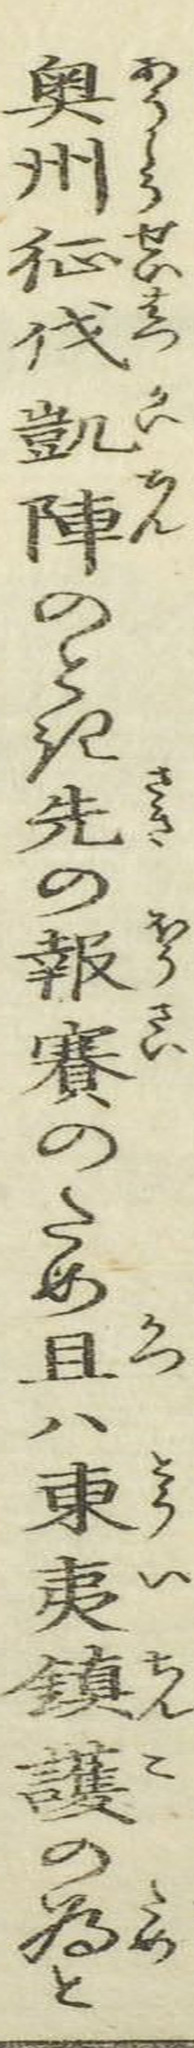奥州征伐凱陣のとき先の報賽のため且は東夷鎮護の為と
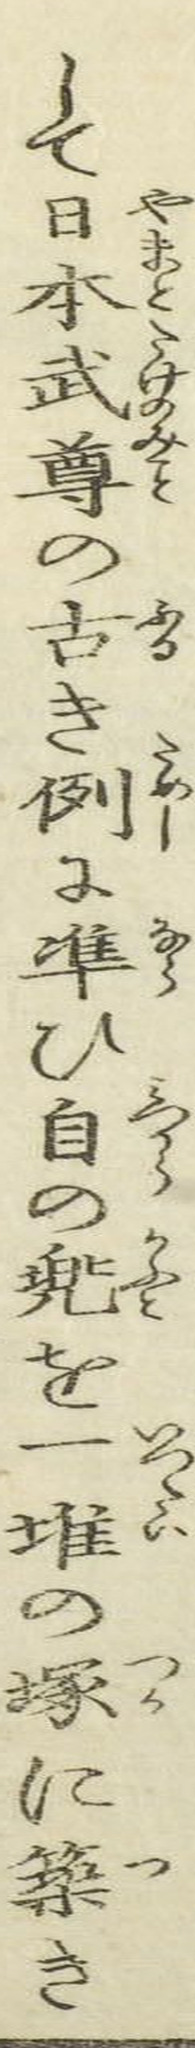して日本武尊の古き例に準ひ自の兜を一堆の塚に築き
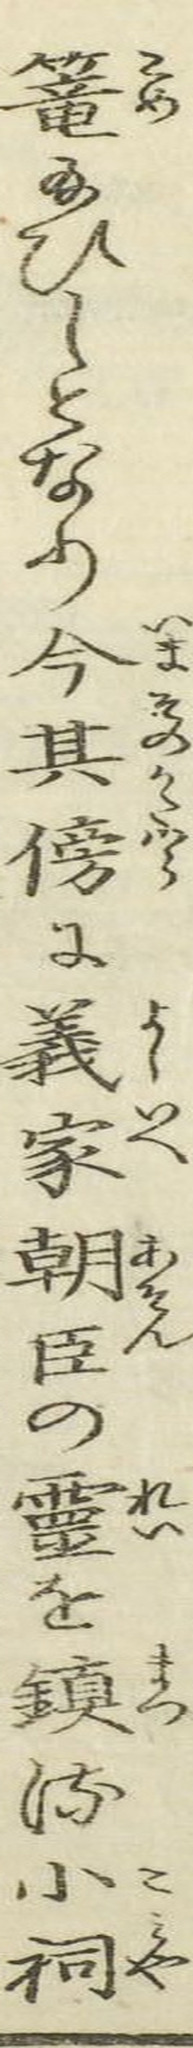篭給ひしとなり今其傍に義家朝臣の霊を鎮る小祠
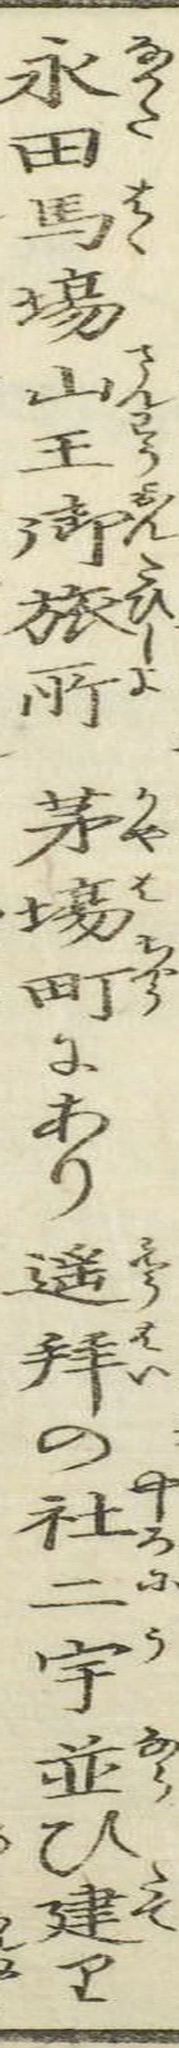永田馬場山王御旅所茅場町にあり遥拝の社二宇並ひ建り
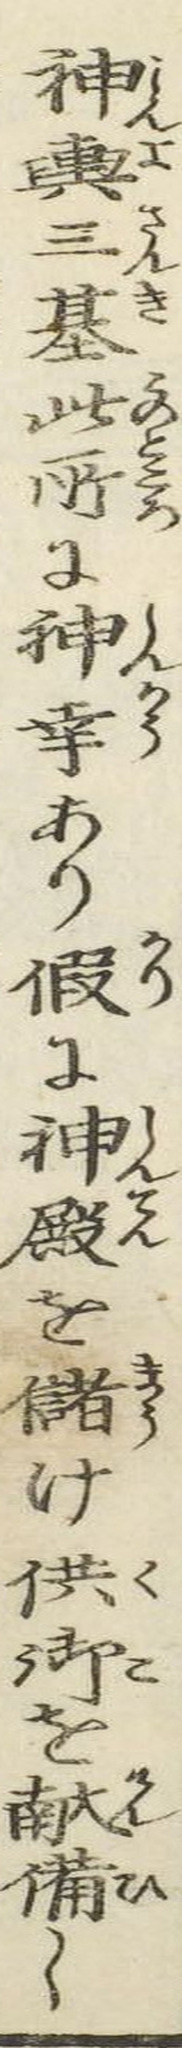神輿三基此所に神幸あり假に神殿を儲け供御を献備し
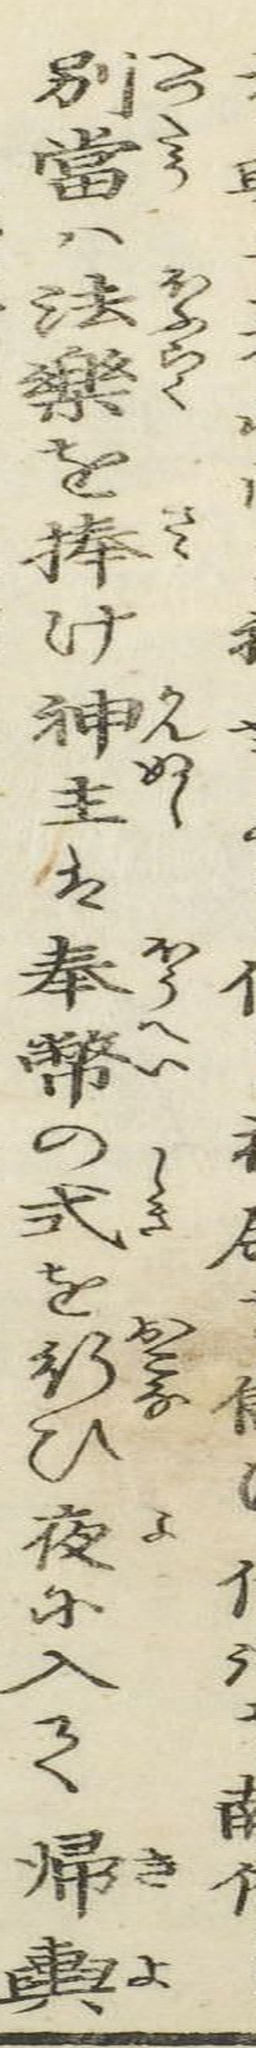別當は法楽を捧け神主は奉幣の式を行ひ夜に入て帰輿
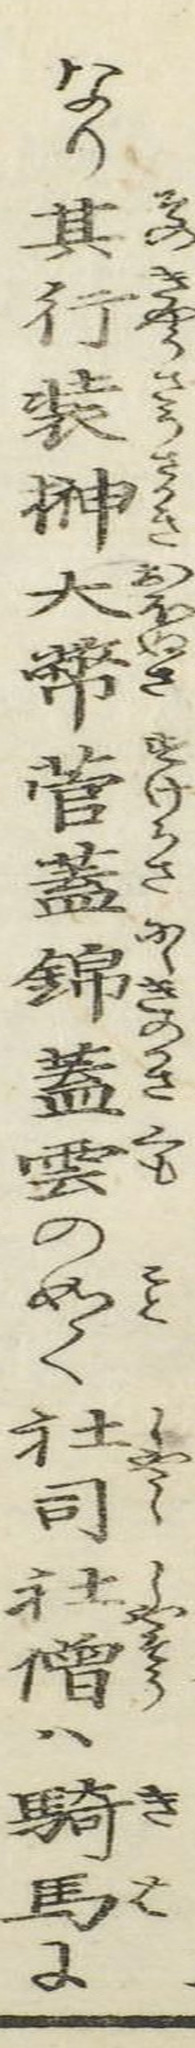なり其行装榊大幣菅蓋錦蓋雲の如く社司社僧は騎馬に
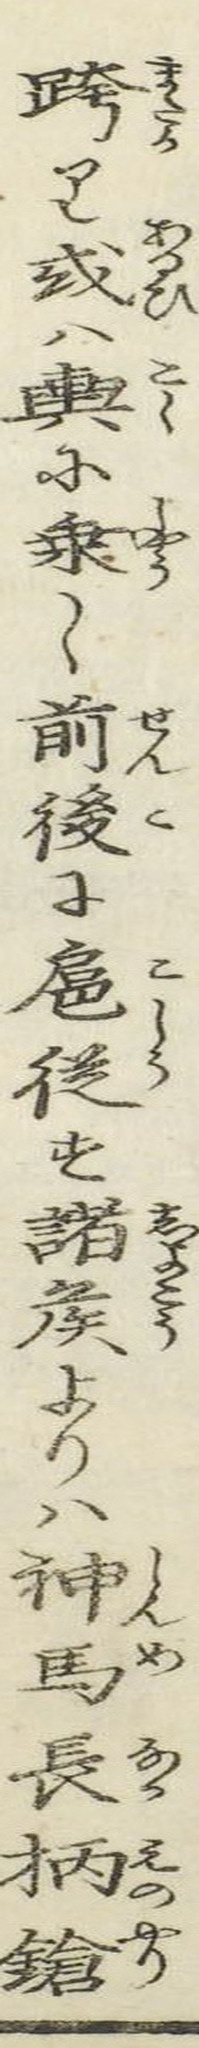跨り或は輿に乗し前後に扈従す諸侯よりは神馬長柄鎗
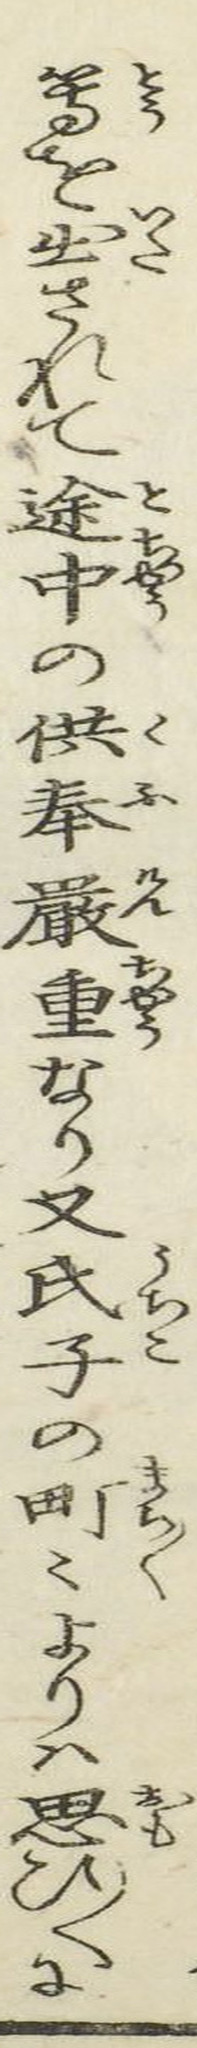等を出されて途中の供奉厳重なり又氏子の町々よりは思ひ〳〵に
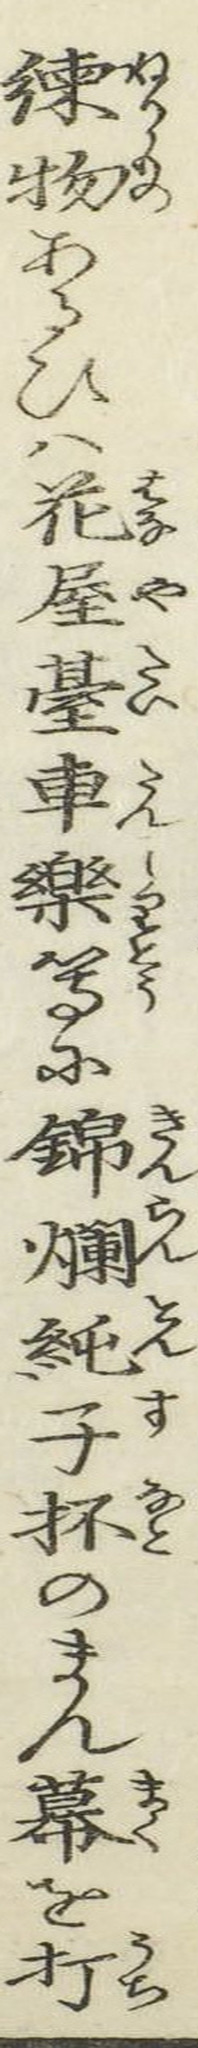練物あるひは花屋臺車楽等に錦爛純子抔のまん幕を打
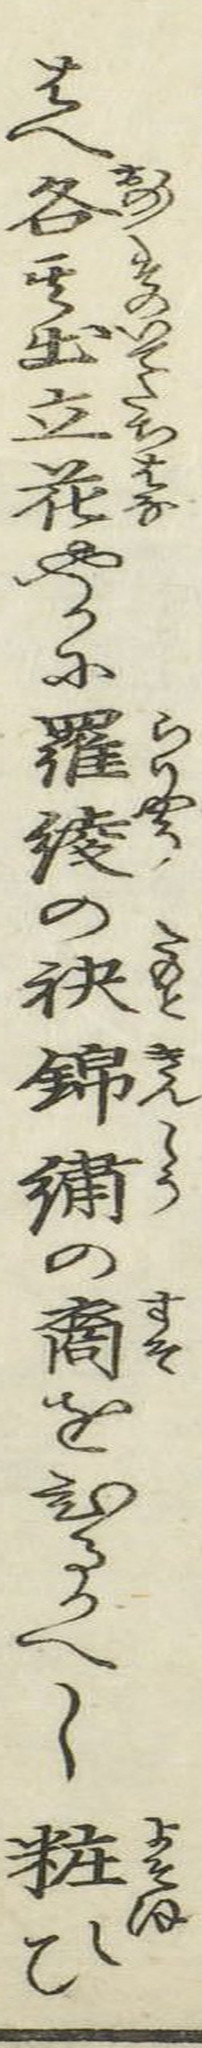はへ各其出立花やかに羅綾の袂錦繡の裔をひるかへし粧ひ
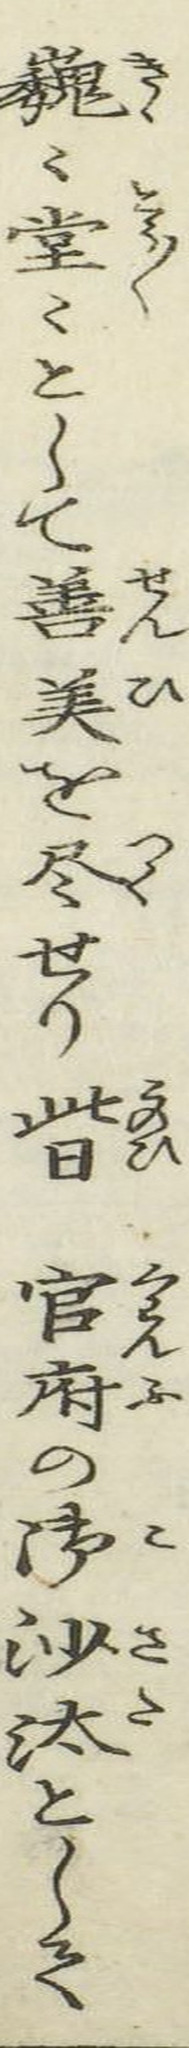巍々堂々として善美を尽せり此日官府の御沙汰として
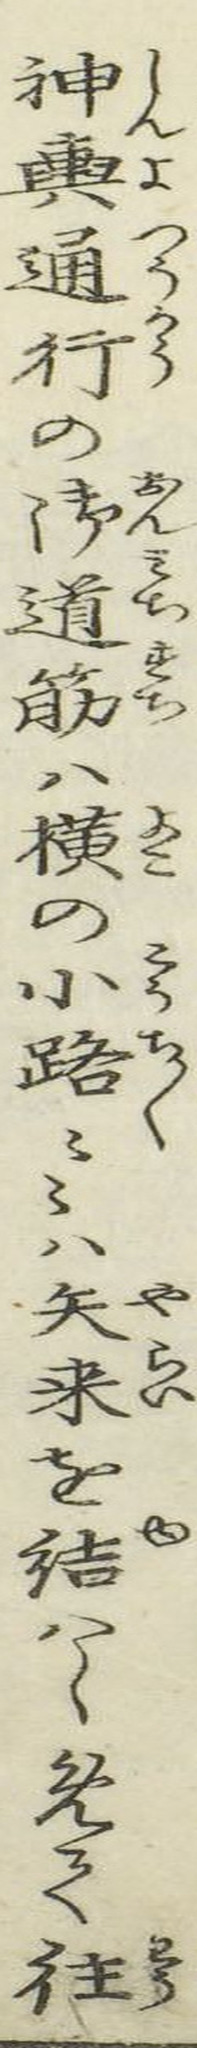神輿通行の御道筋は横の小路々々は矢来を結はしめて往
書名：江戸名所図会 20巻 巻之2
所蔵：東京学芸大学教育コンテンツアーカイブ
